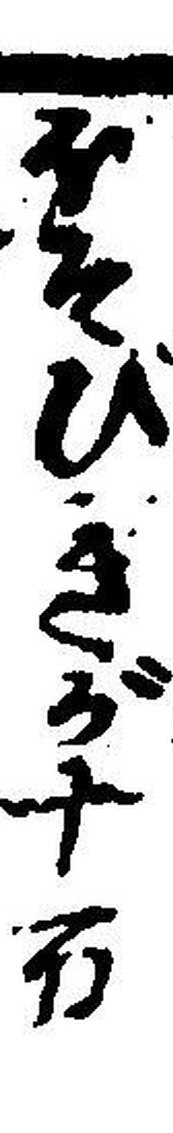ほそびきが十万
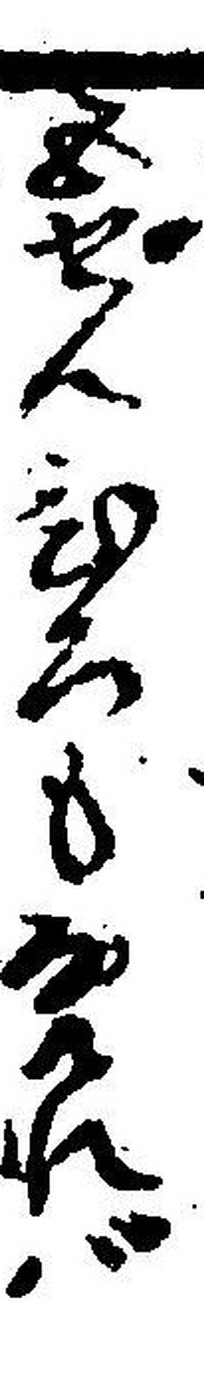五せんひろもなければ
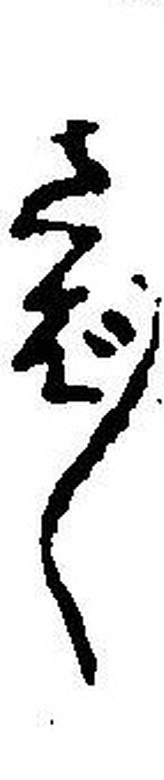たば〳〵
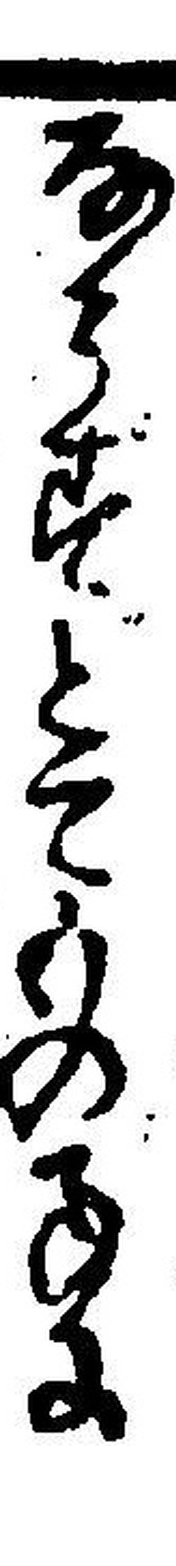ならずとてもの事に
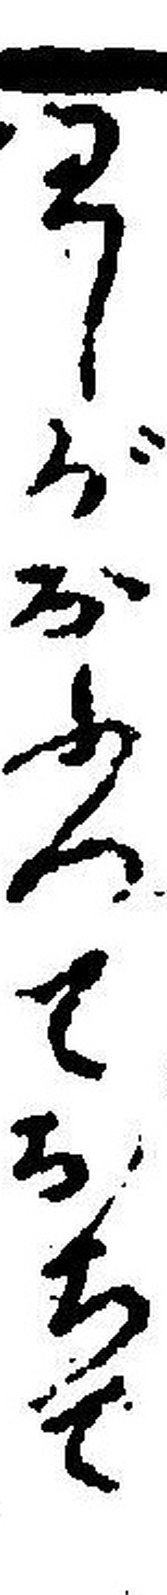わしがおふつておちて
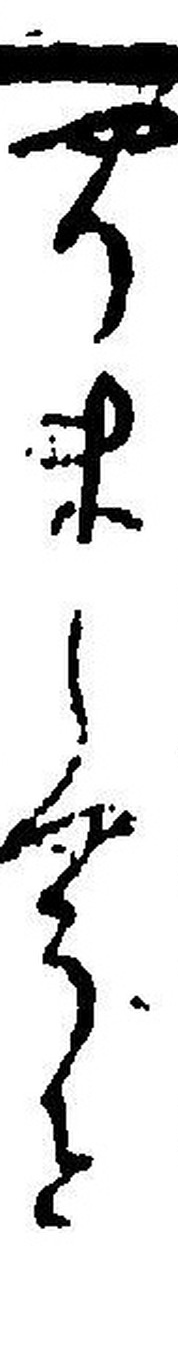やりましやうと
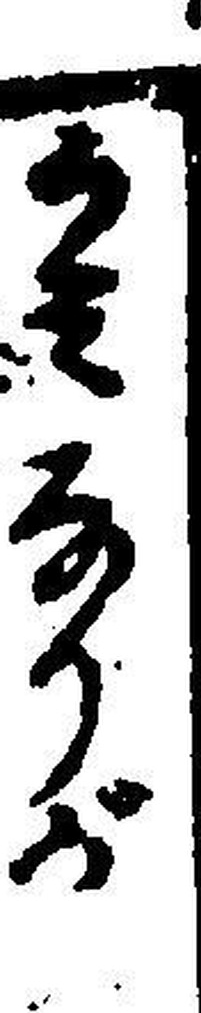かみなりが
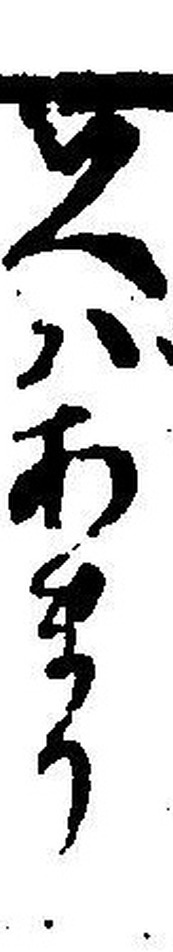いへばあまり
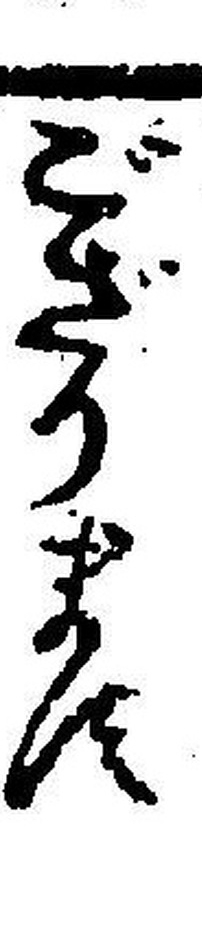ござります
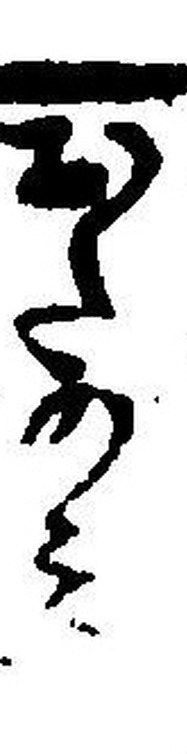おたのみ
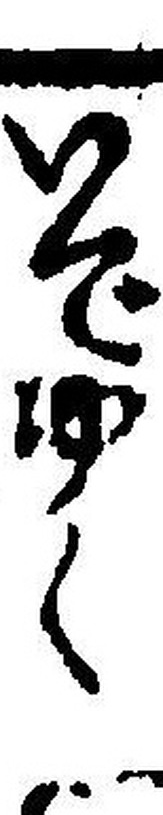いでゆく
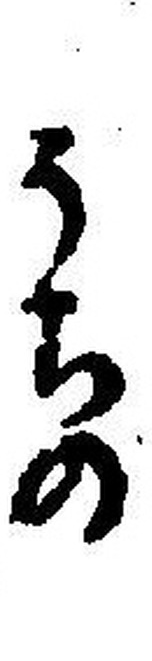うちの
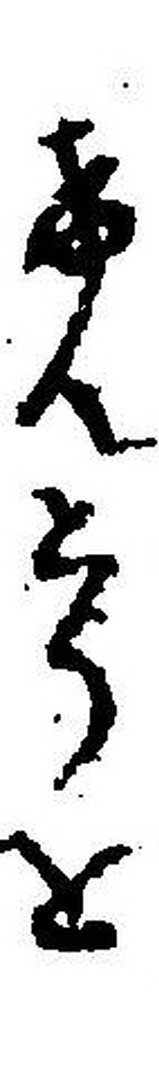けんとうを
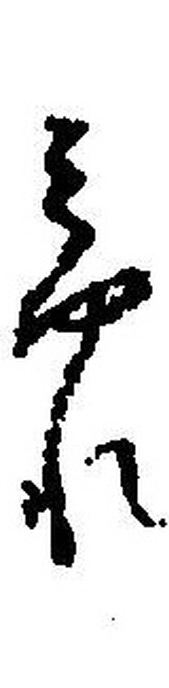みやれ

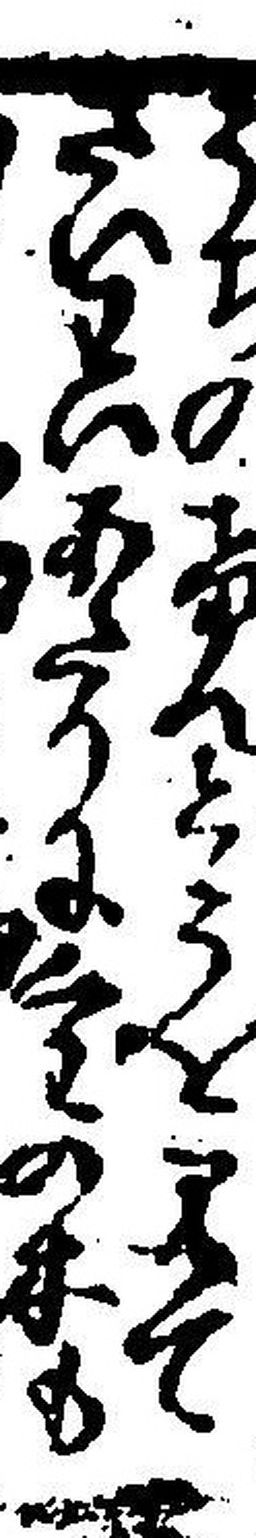さいわいあたりにくわの木も
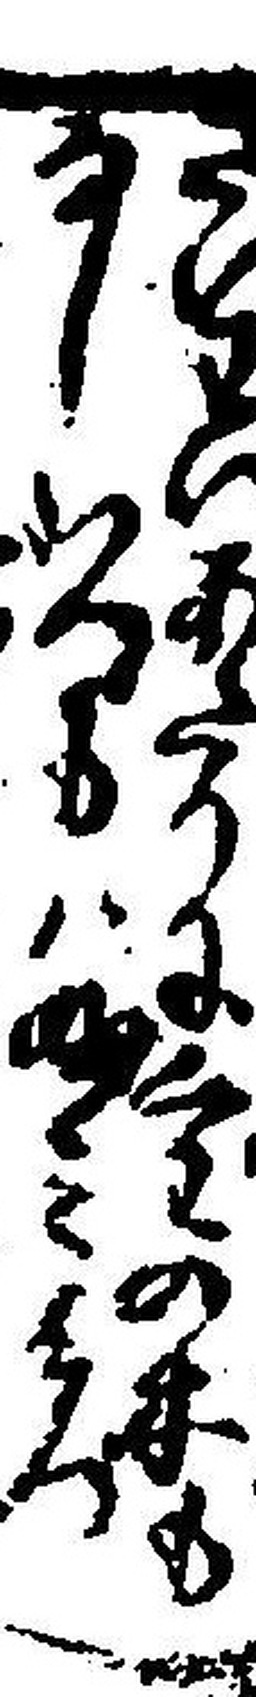なしいつもはふみはつ
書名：牡丹餅棚有 / 市場通笑作
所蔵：東京大学総合図書館 General Library in the University of Tokyo, JAPAN
